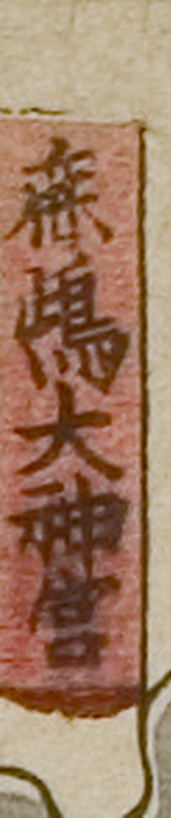鹿嶋の神の
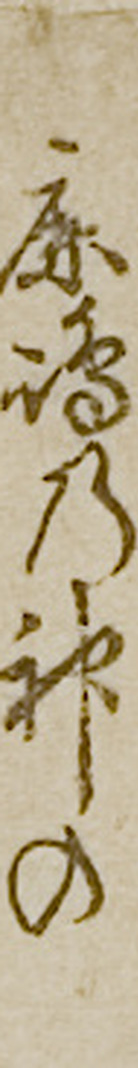鹿嶋の神の
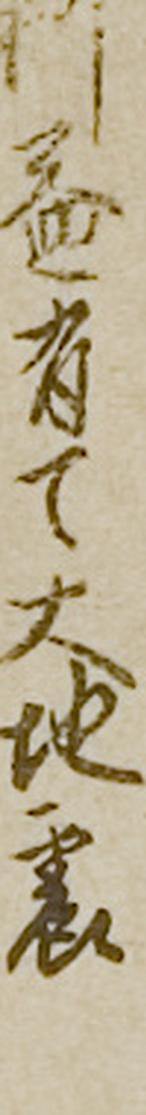利益有て大地震
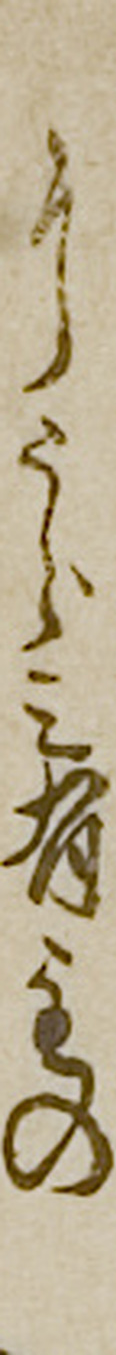にうらみ有もの
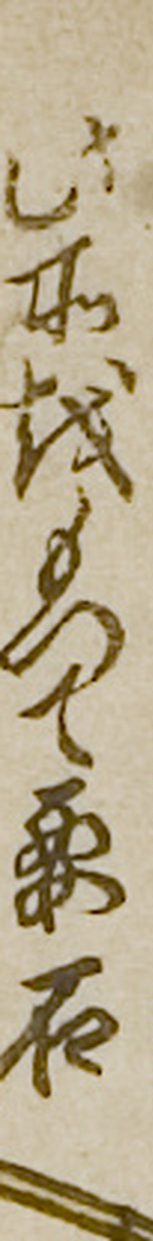此所をもつて要石
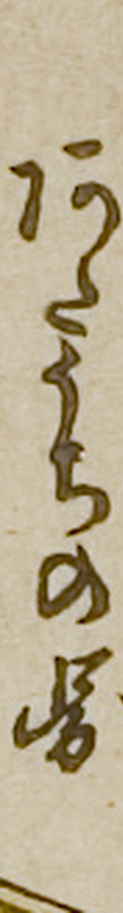あたうちの衛
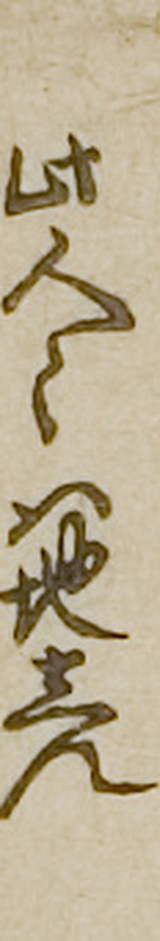此人々は地しん
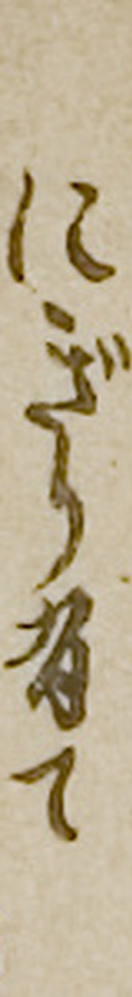にぎり有て
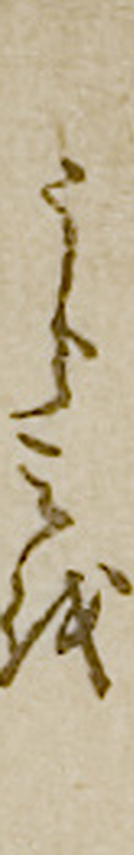うらみを
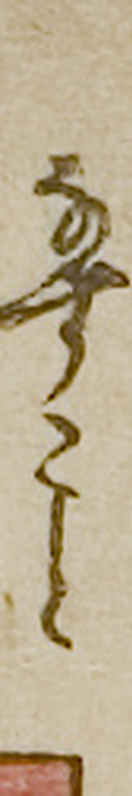なすこと
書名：[要石補助力にてあたうちの図]
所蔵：東京大学総合図書館 General Library in the University of Tokyo, JAPAN
